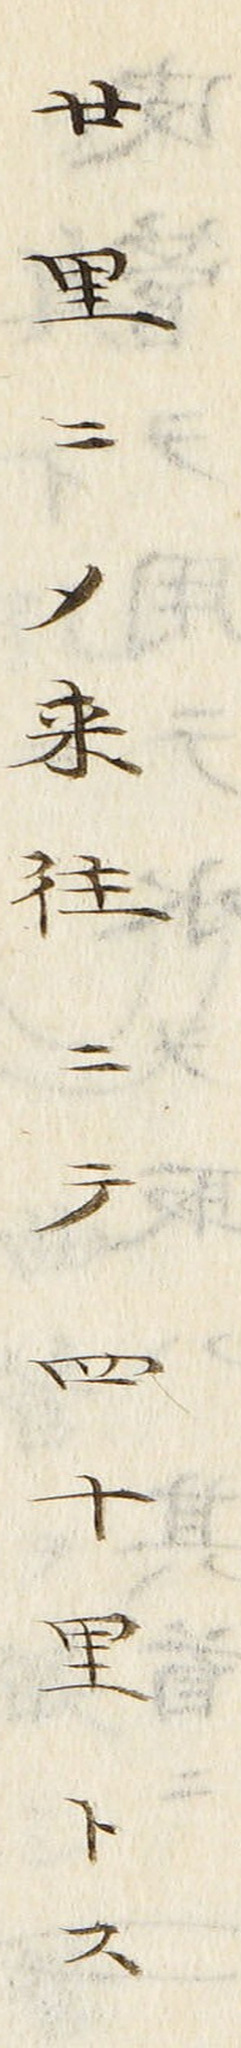廿里ニシテ来往ニテ四十里トス
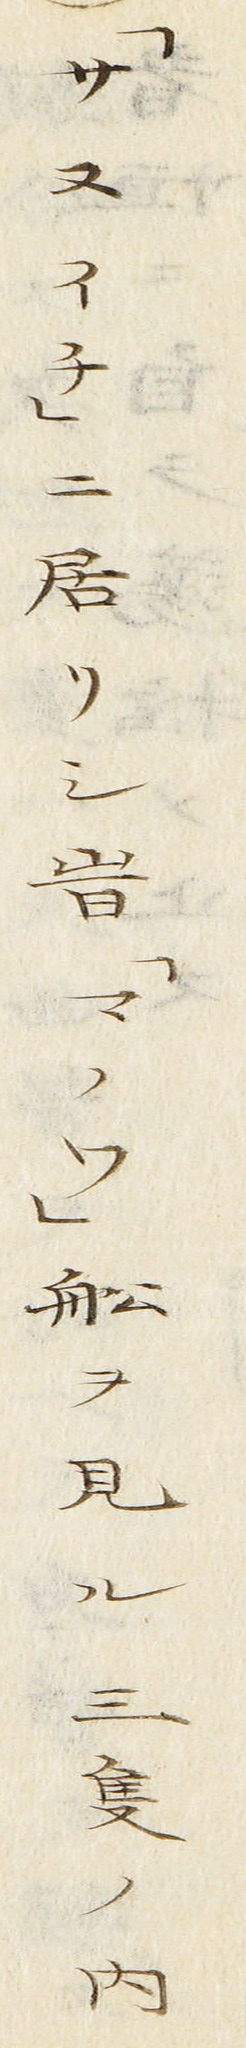〇「サスイチ」ニ居リシ旹「マノワ」舩ヲ見ル三隻ノ内
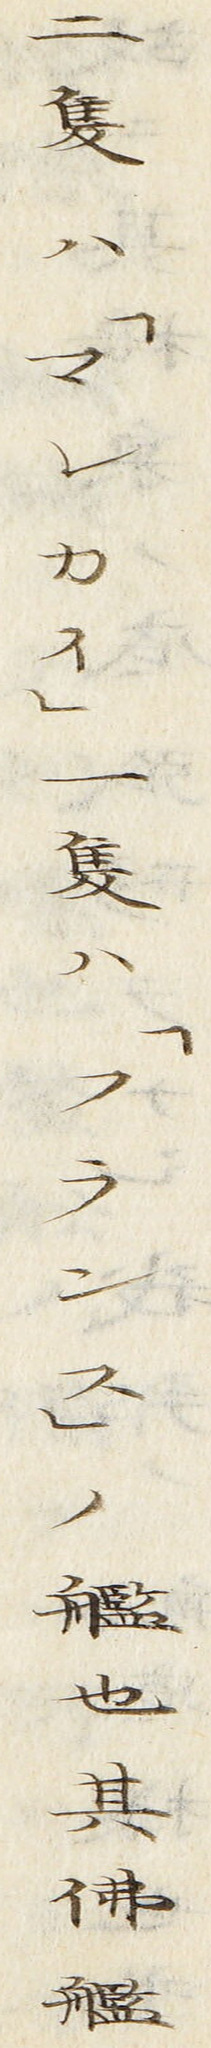二隻ハ「マレカイ」一隻ハ「フランス」ノ艦也其佛艦
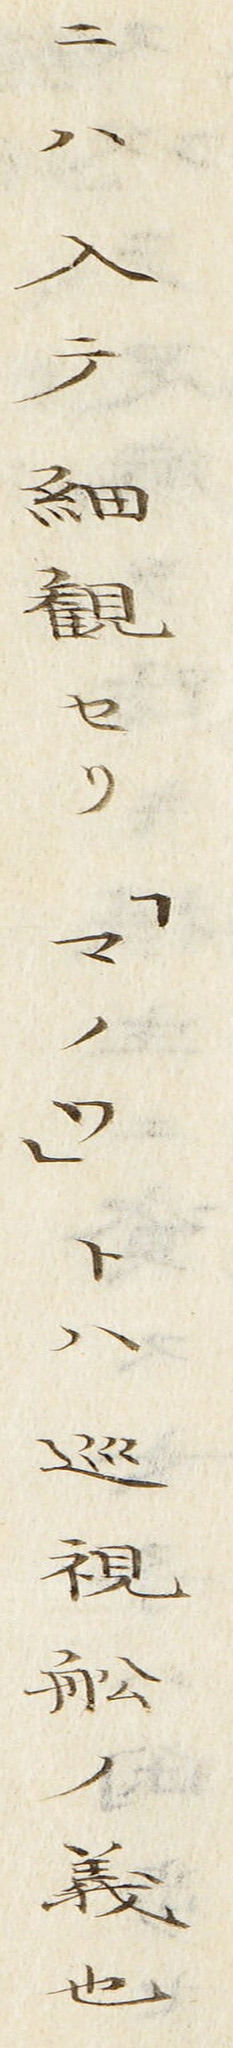ニハ入テ細観セリ「マノワ」トハ巡視舩ノ義也
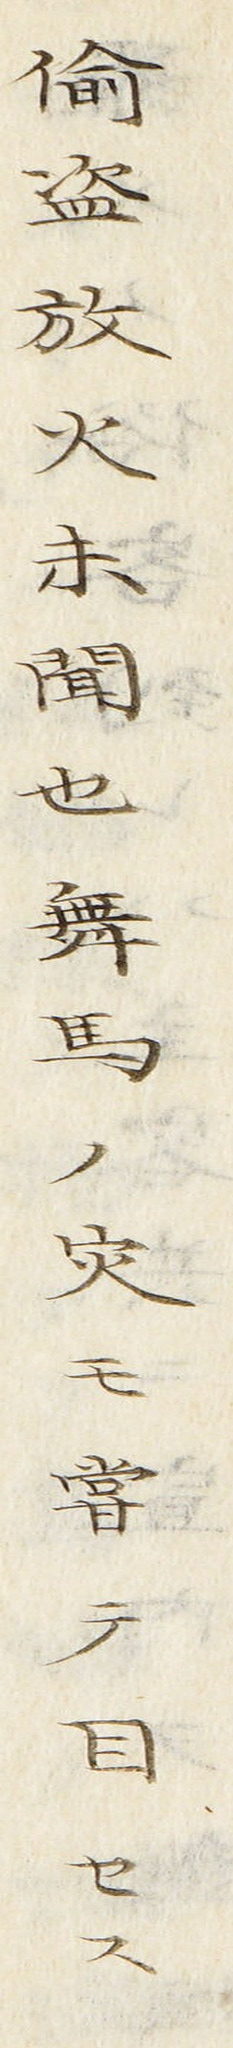〇偸盗放火未聞也舞馬ノ灾モ嘗テ目セス
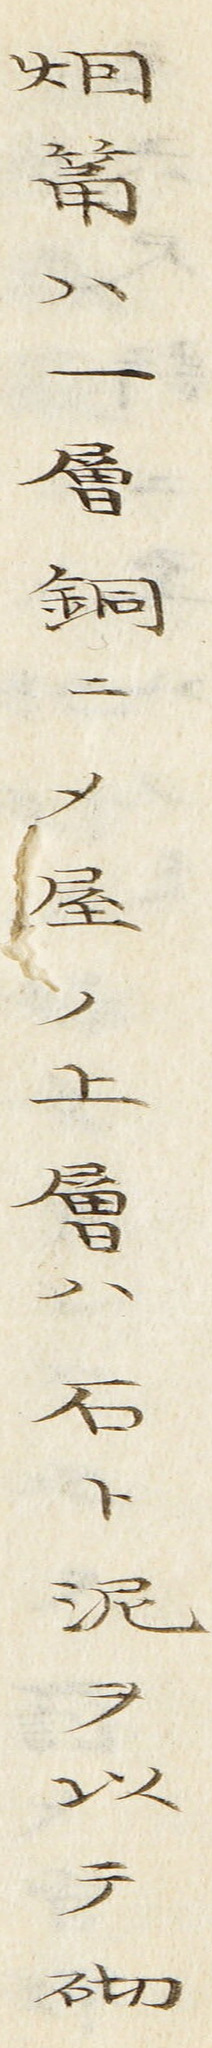〇烟筩ハ一層銅ニシテ屋ノ上層ハ石ト泥ヲ以テ砌
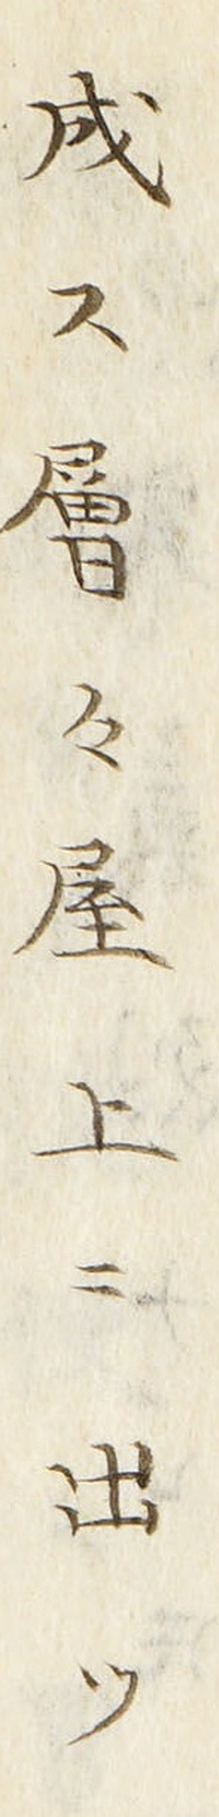成ス層々屋上ニ出ツ
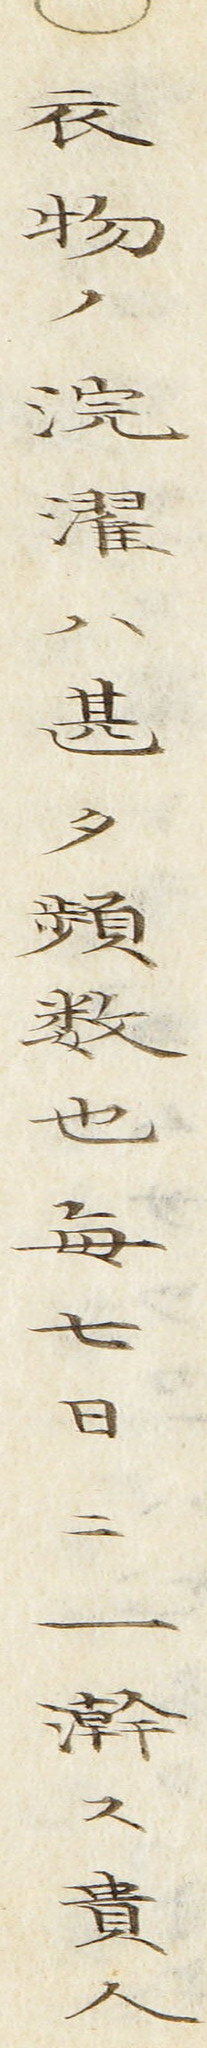〇衣物ノ浣濯ハ甚タ頻数也毎七日ニ一澣ス貴人
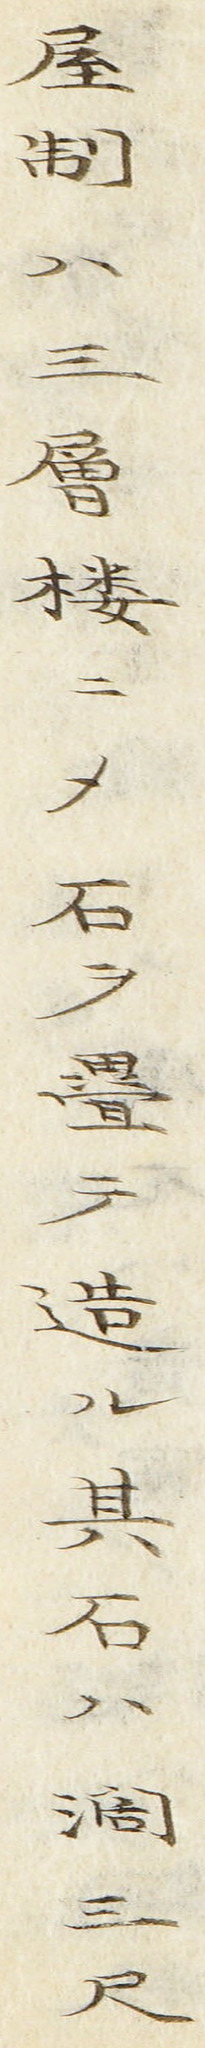○屋制ハ三層楼ニシテ石ヲ畳テ造ル其石ハ濶三尺

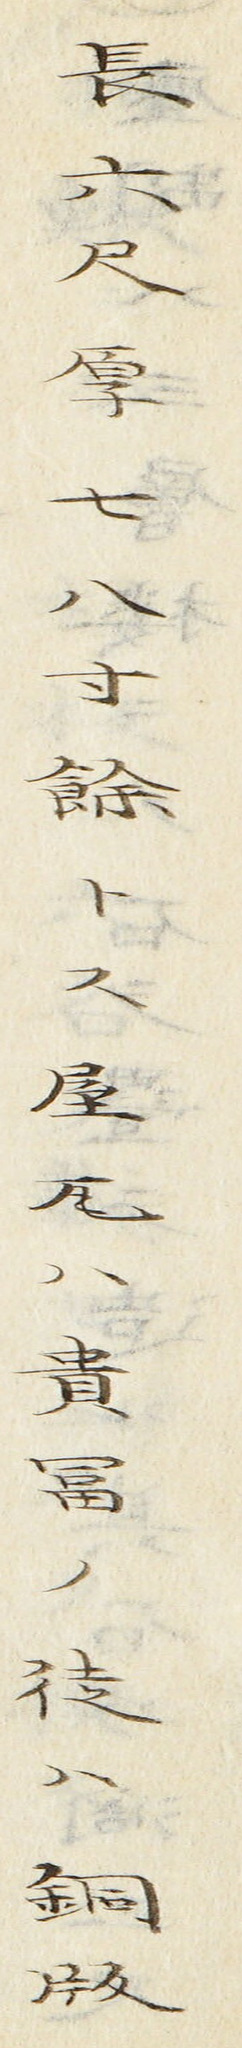長六尺厚七八寸餘トス屋瓦ハ貴冨ノ徒ハ銅版
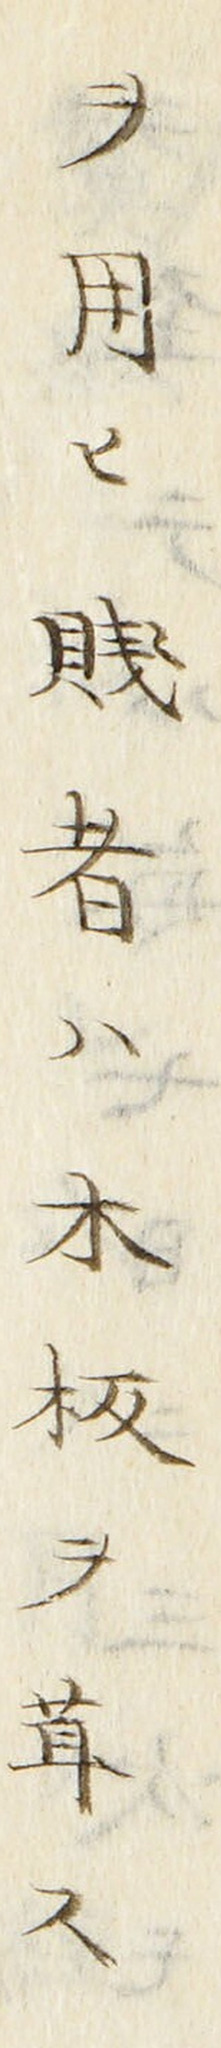ヲ用ヒ賤者ハ木板ヲ葺ス
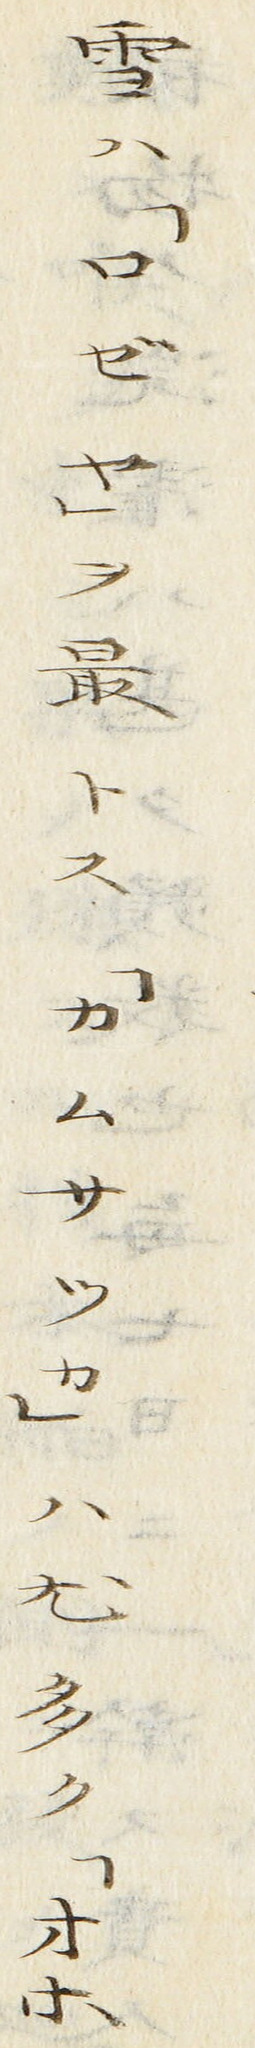〇雪ハ「ロゼヤ」ヲ最トス「カムサツカ」ハ尤多ク「オホ
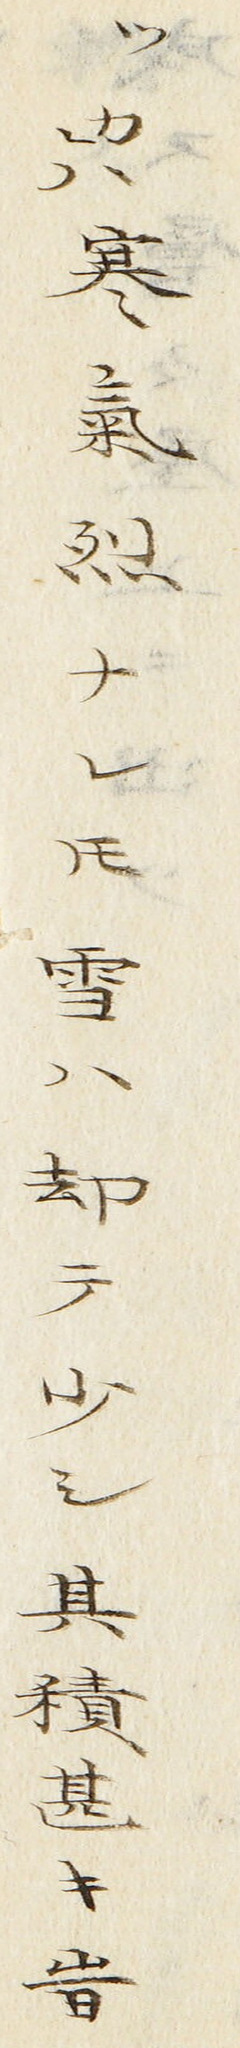ツカ」ハ寒氣烈ナレトモ雪ハ却テ少シ其積甚キ旹
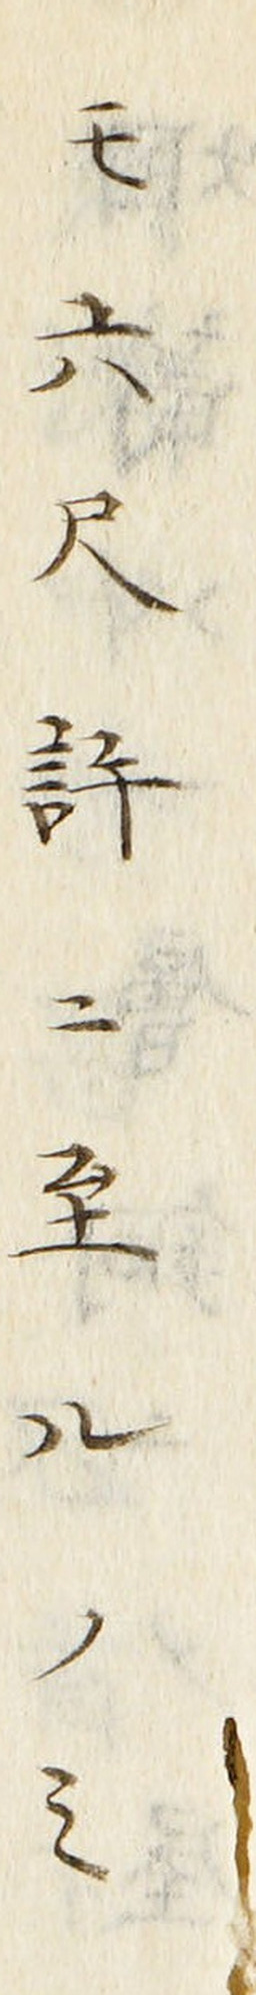モ六尺許ニ至ルノミ
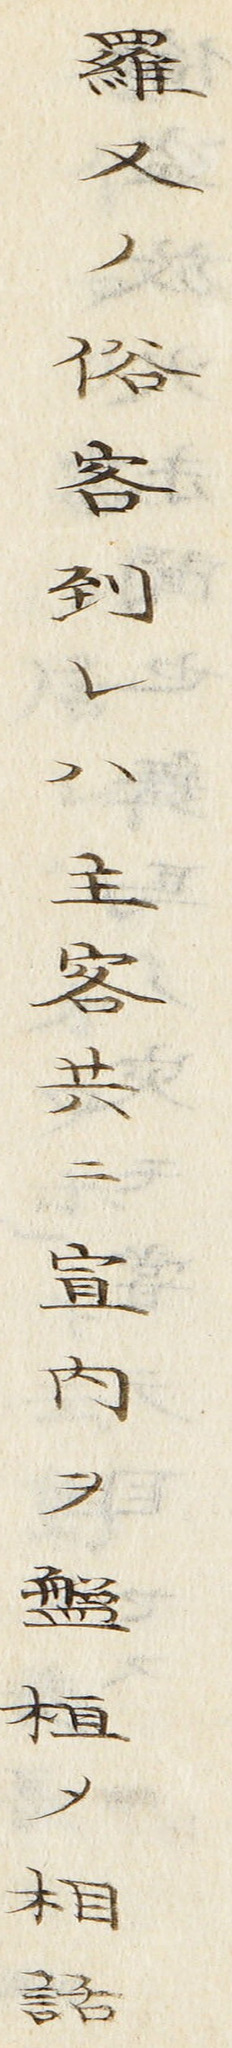〇羅又ノ俗客到レハ主客共ニ宣内ヲ盤桓シテ相語
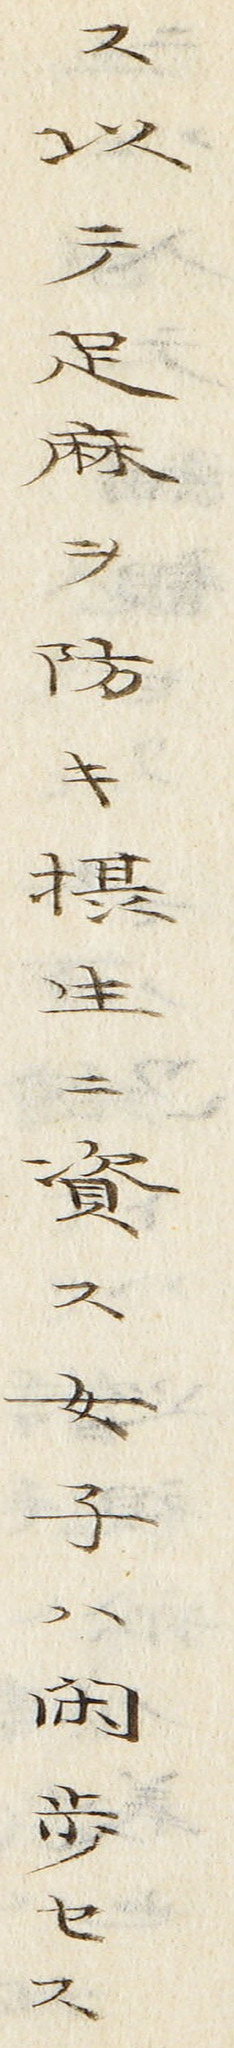ス以テ足麻ヲ防キ摂生ニ資ス女子ハ閑歩セス
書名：蕃談
